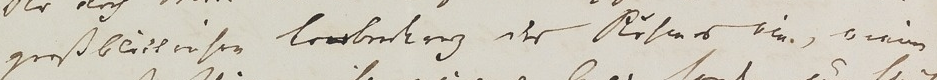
großblättrichen Lorbeerkranz des Ruhmes ein, meine
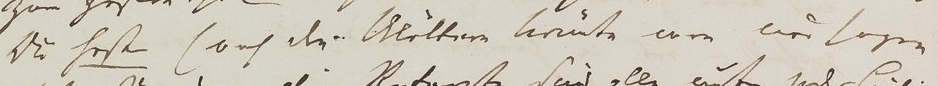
Du hast (nach den Blättern könnte man nur sagen
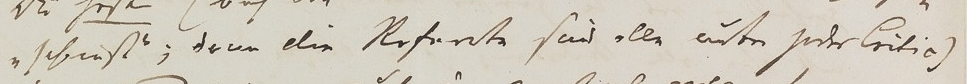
«scheinst»; denn die Referate sind alle unter jeder Critic)
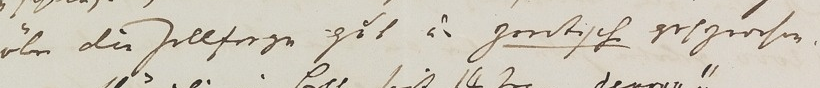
über die Zollfrage gut u. practisch gesprochen.
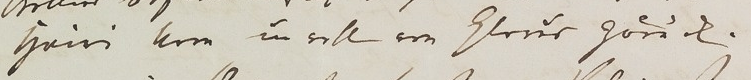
Heiri kam unwohl von Glarus zurück.
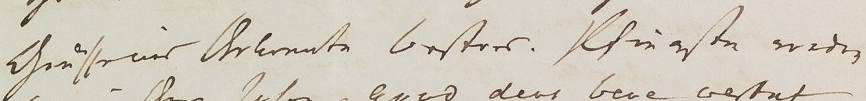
Grüsse mir Bekannte bestens. Pfingsten werden
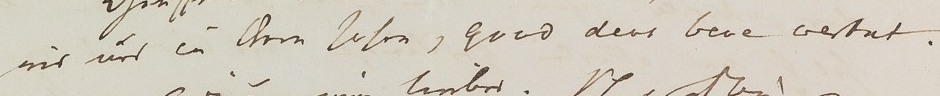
wir uns in Bern sehen, quod deus bene vertat.
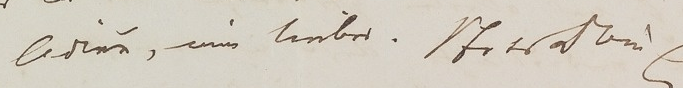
Adieu, mein Lieber. Stets Dein
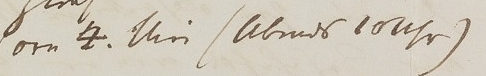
am 4. Mai (Abends 10 Uhr)
